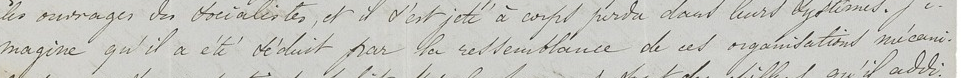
magine qu'il a été séduit par la ressemblance de ces organisations mécani-
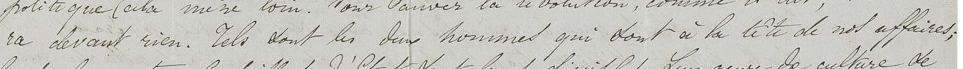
ra devant rien. Tels sont les deux hommes qui sont à la tête de nos affaires;
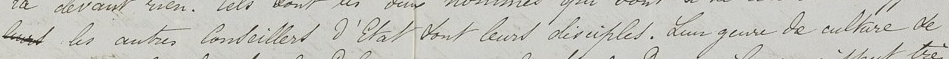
leurs les autres Conseillers d'Etat sont leurs disciples. Leur genre de culture se
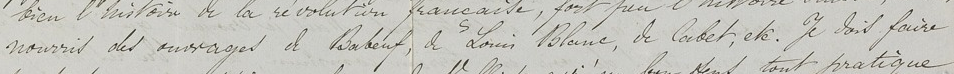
nourris des ouvrages de Babeuf, de Louis Blanc, de Cabet, etc. Je dois faire
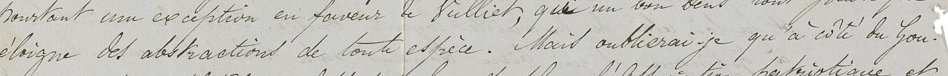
éloigne des abstractions de toute espèce. Mais oublierai-je qu'à côté du Gou-
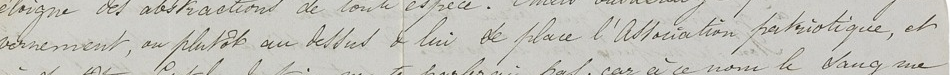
vernement, ou plutôt au dessus de lui se place l'Association patriotique, et
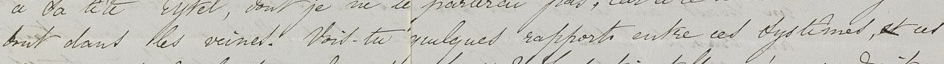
bruit dans le veines. Vois-tu quelques rapports entre ces systèmes, et ces
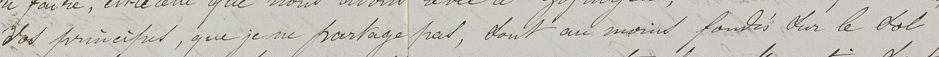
Vos principes, que je ne partage pas, sont au moins fondés sur le sol
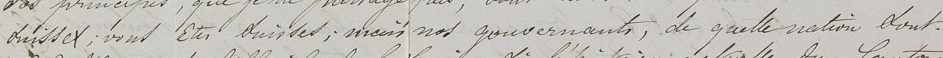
suisses; vous êtes Suisses; mais nos gouvernants, de quelle nation sont-
